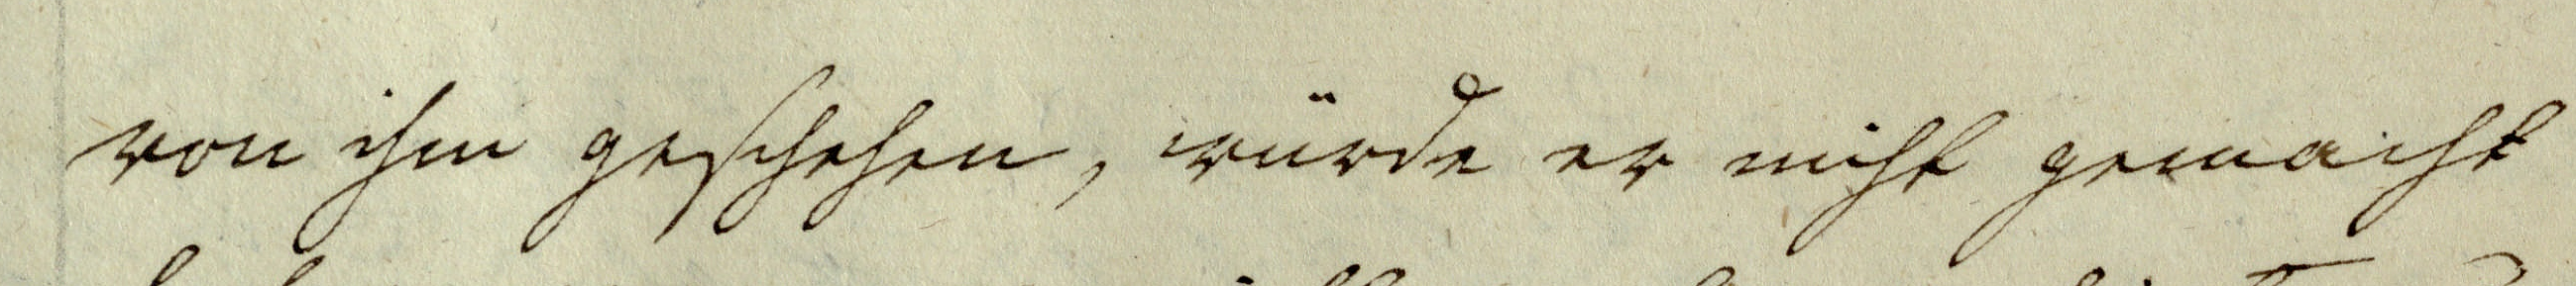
von ihm geschehen, würde er nicht gemacht
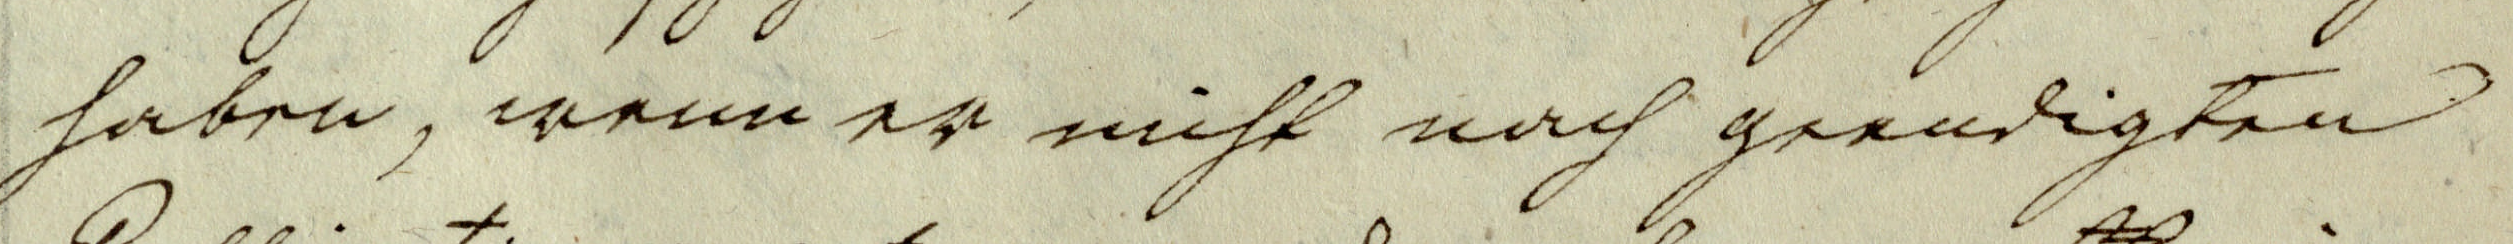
haben, wenn er nicht nach geendigten
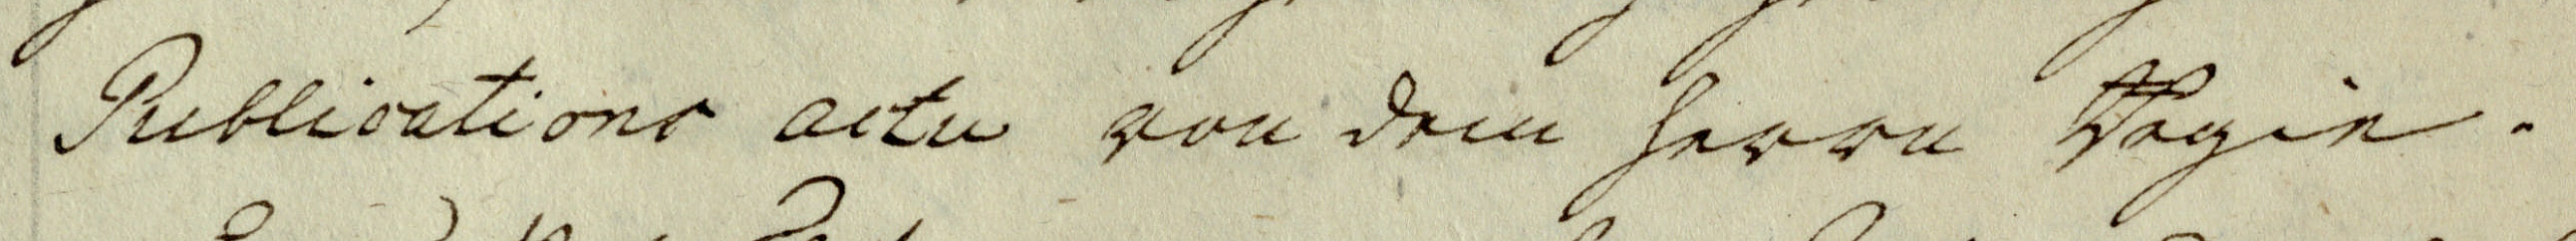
Publications Actu von dem Herrn Regie¬
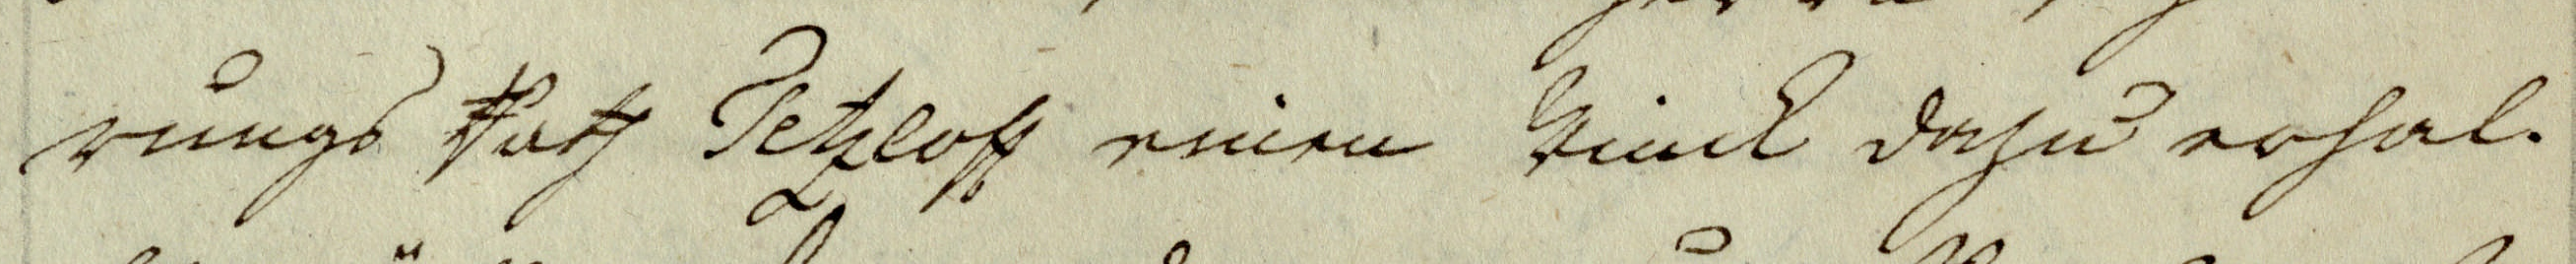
rungs Rath Tetzloff einen Winck dazu erhal¬
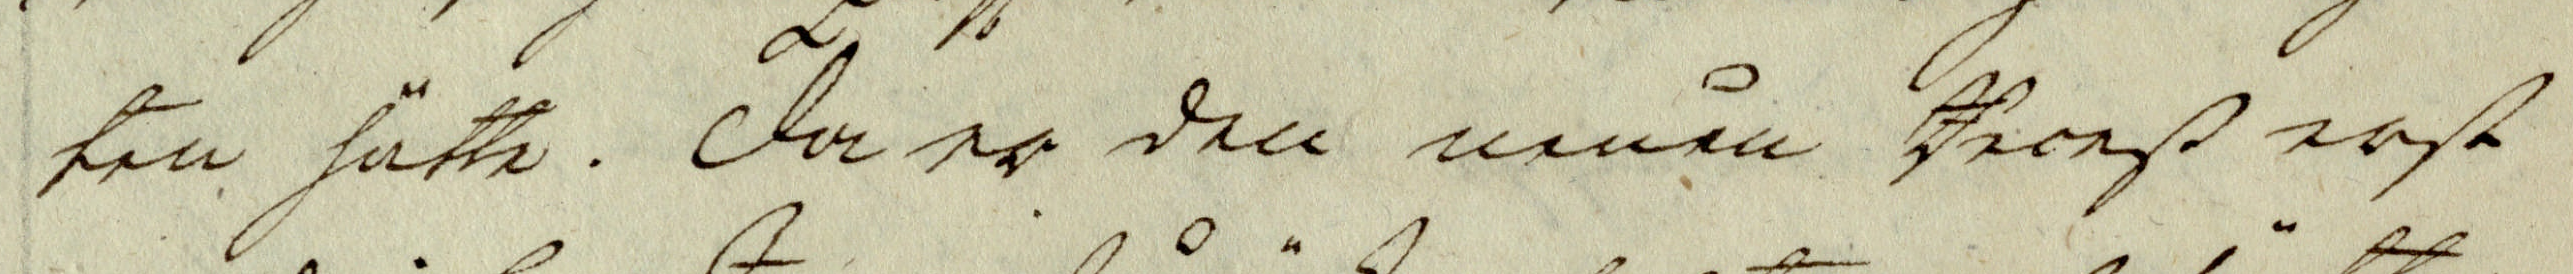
ten hätte. Da er den neuen Receß erst
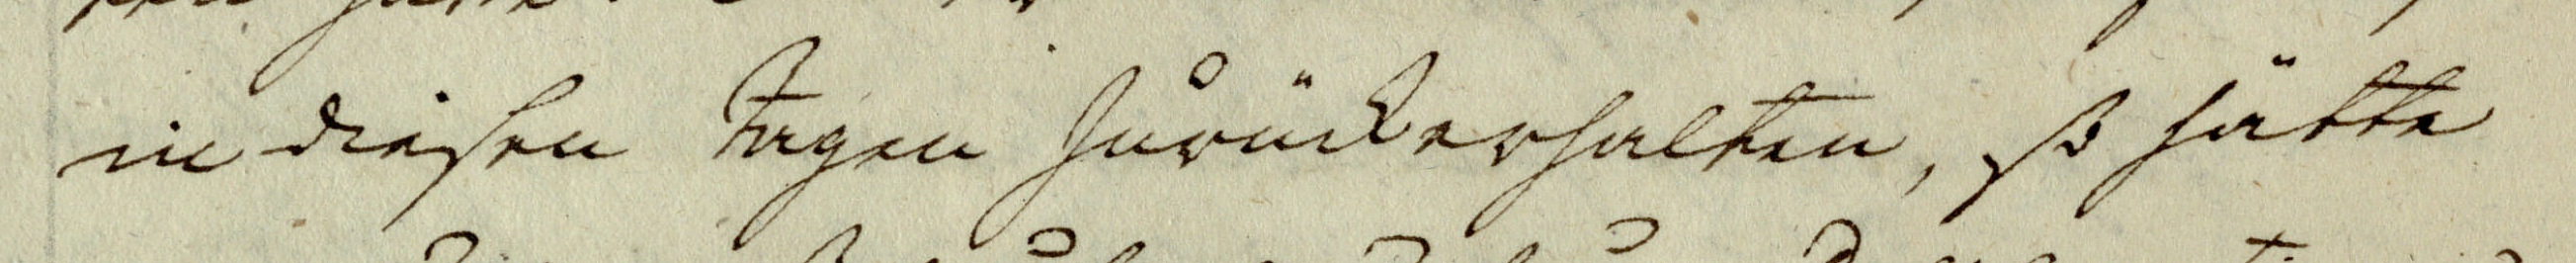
in diesen Tagen zurückerhalten, so hätte
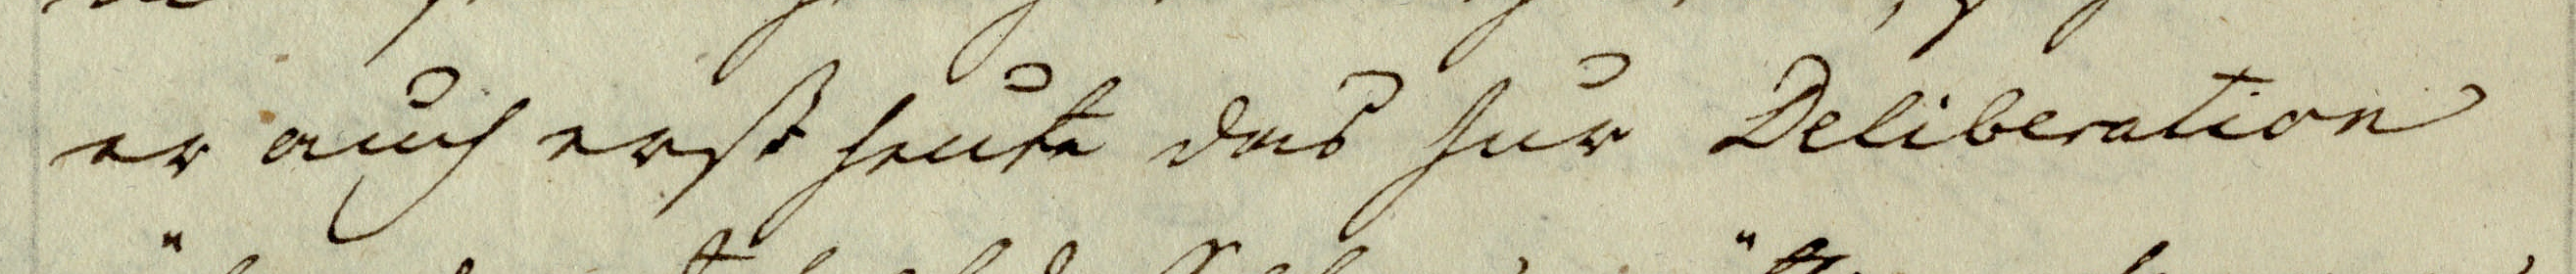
er auch erst heute das zur Deliberation
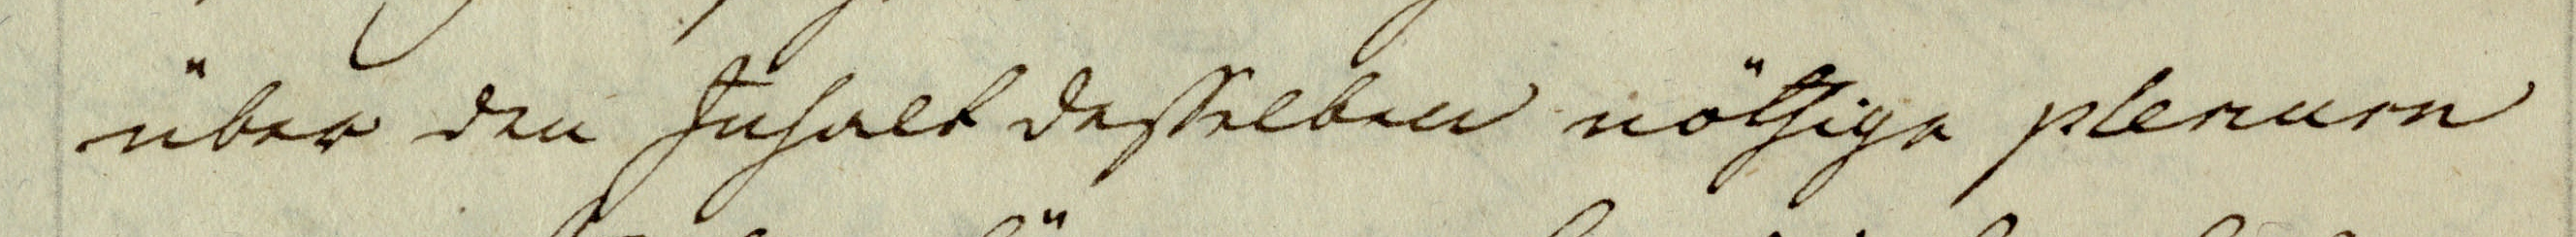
über den Inhalt desselben nöthige plenum
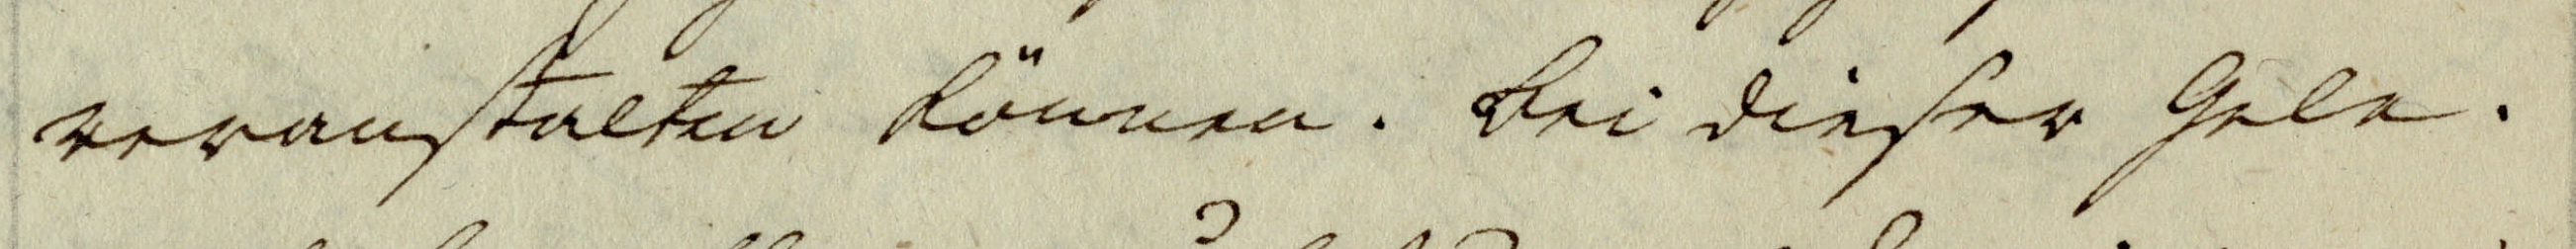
veranstalten können. Bei dieser Gele¬
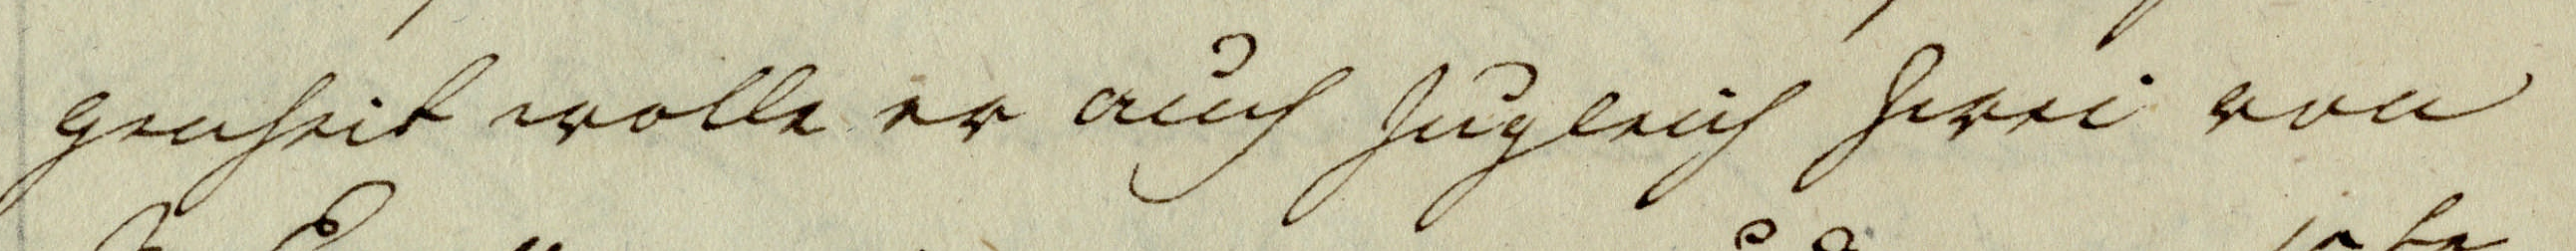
genheit wolle er auch zugleich zwei von
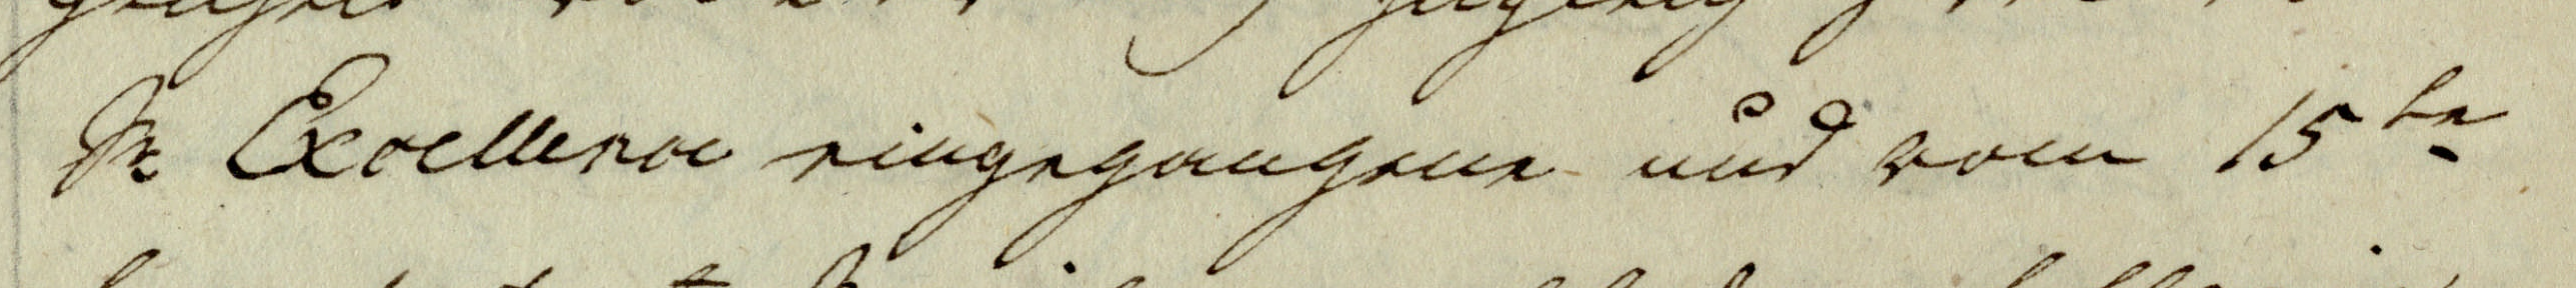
Sr Excellence eingegangene und vom 15 te
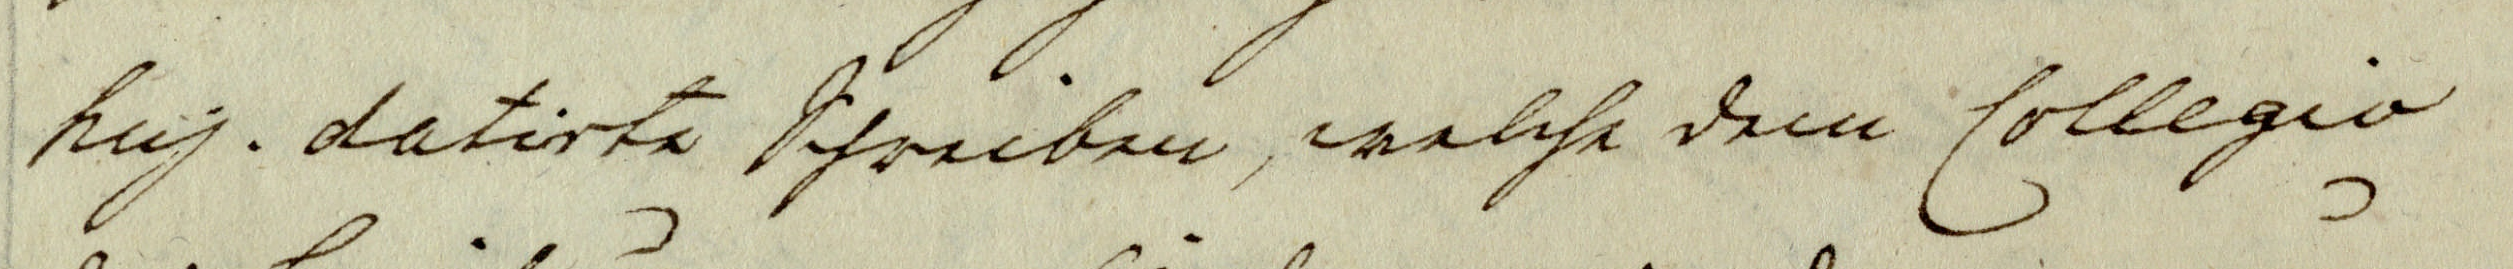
huj. datirte Schreiben, welche dem Collegio
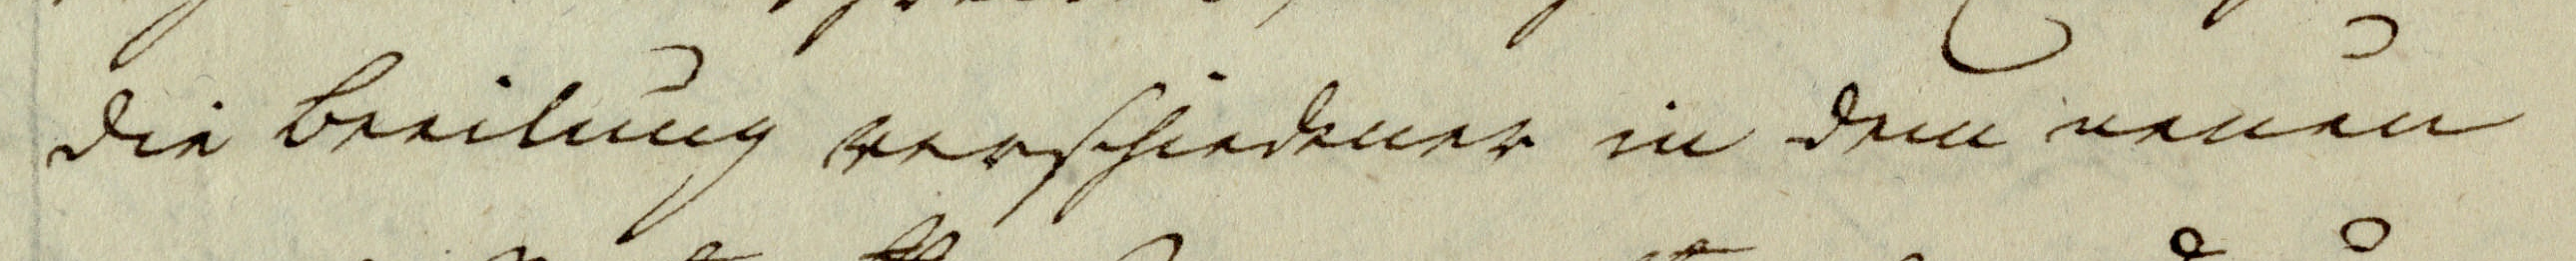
die Beeilung verschiedener in dem neuen
